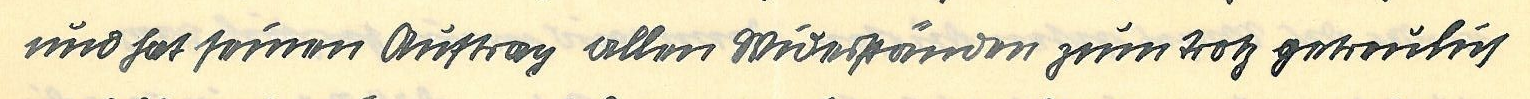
und hat seinen Auftrag allen Widerständen zum Trotz getreulich
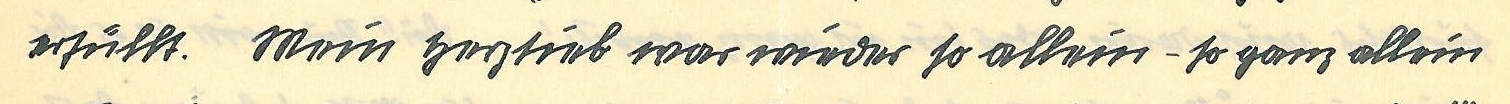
erfüllt. Mein Herzlieb war wieder so allein – so ganz allein
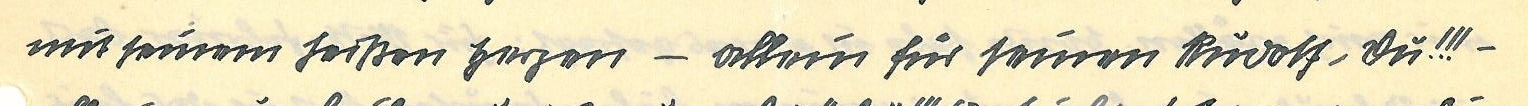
mit seinem heißen Herzen – allein für seinen – Du!!! –
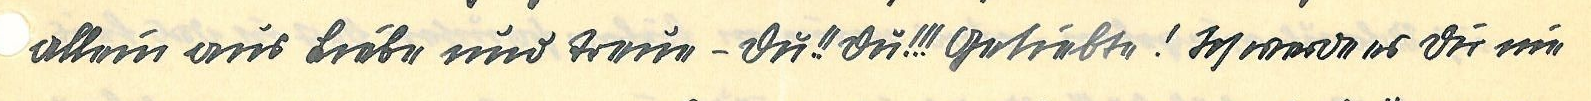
allein aus Liebe und Treue!! Du!! Du!!! Geliebte! Ich werde es Dir nie
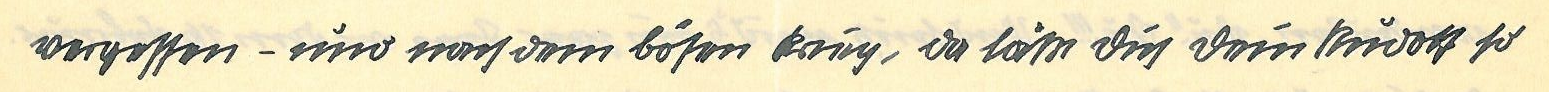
vergessen – und nach dem bösen Krieg, da läßt Dich Dein so
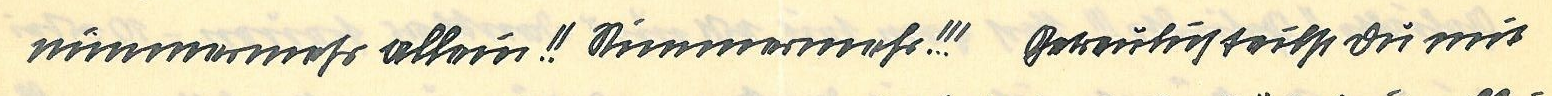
nimmermehr allein!! Nimmermehr!!! Getreulich teilst Du mit
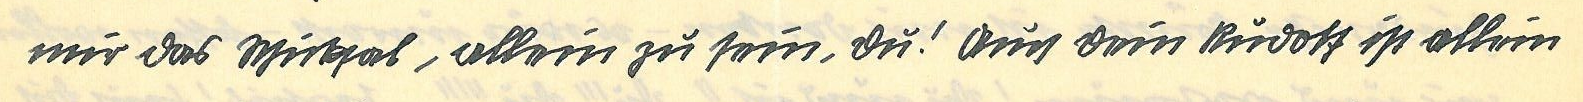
mir das Schicksal, allein zu sein, Du! Auch Dein ist allein
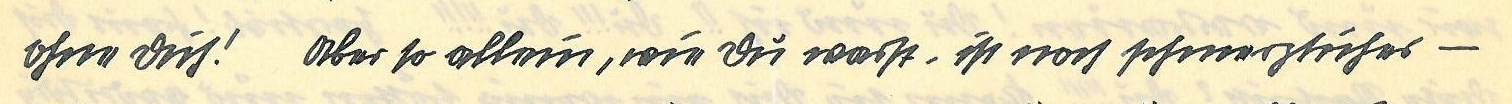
ohne Dich! Aber so allein, wie Du warst, ist noch schmerzlicher –
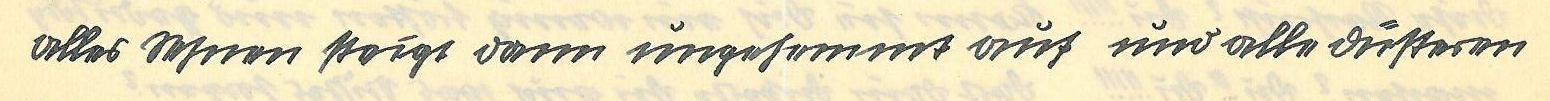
alles Sehnen steigt dann ungehemmt auf und alle düsteren
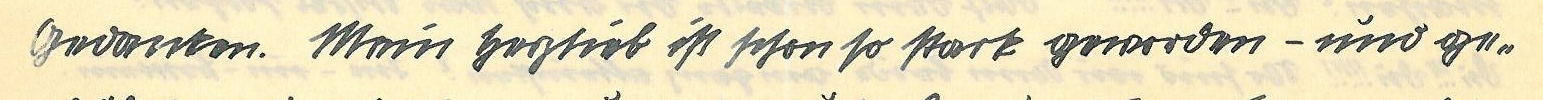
Gedanken. Mein Herzlieb ist schon so stark geworden – und ge¬
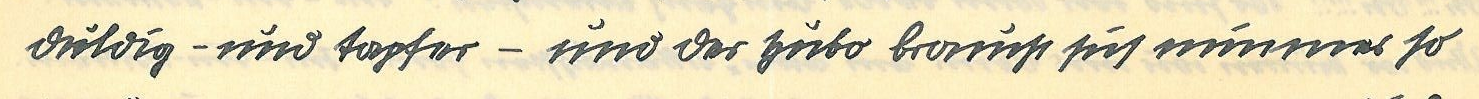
duldig – und tapfer – und der Hubo braucht sich nimmer so
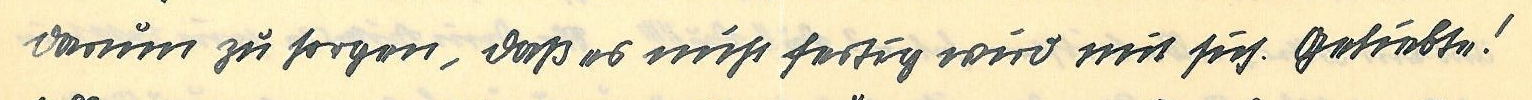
darum zu sorgen, daß es nicht fertig wird mit sich. Geliebte!
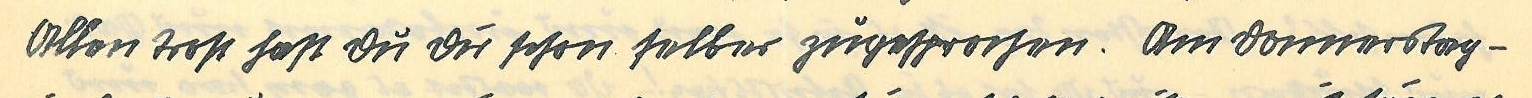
Allen Trost hast Du Dir schon selber zugesprochen. Am Donnerstag –
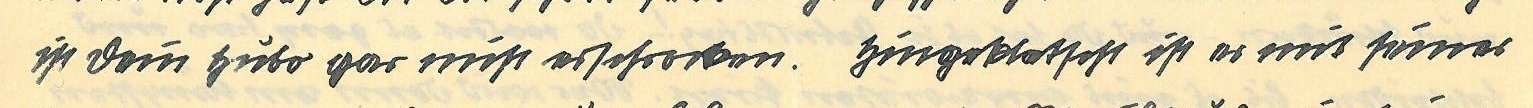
ist Dein Hubo gar nicht erschrocken. Hingeklatscht ist er mit seiner
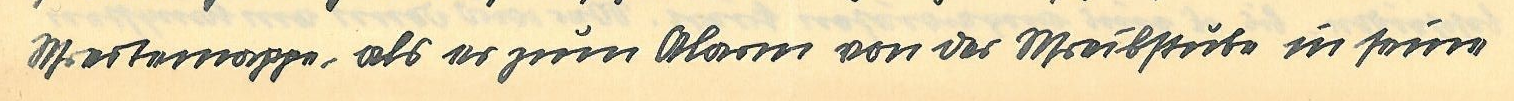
Schreibemappe, als er zum Alarm von der Schreibstube in seine
